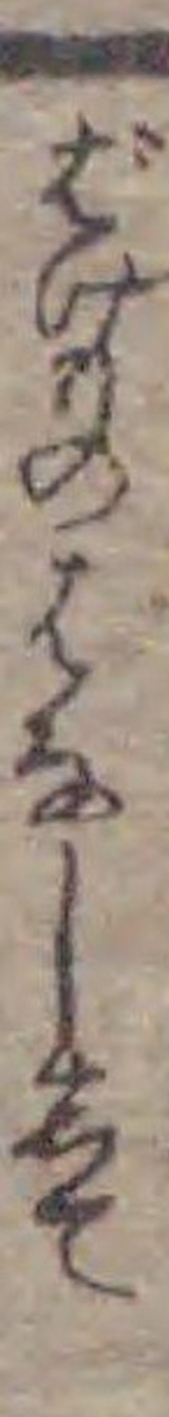ばけものはなしして
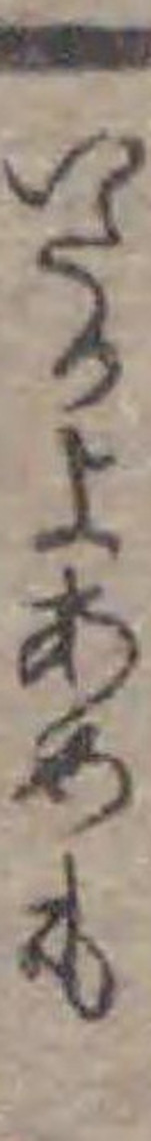いたりよあめも
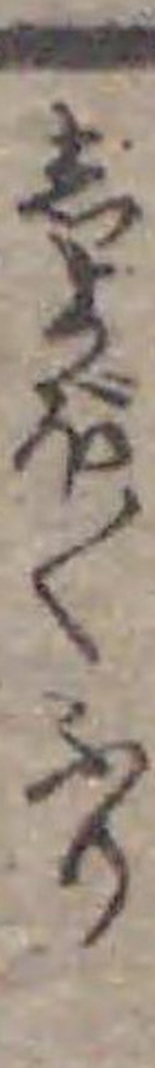しよぼ〳〵ふり
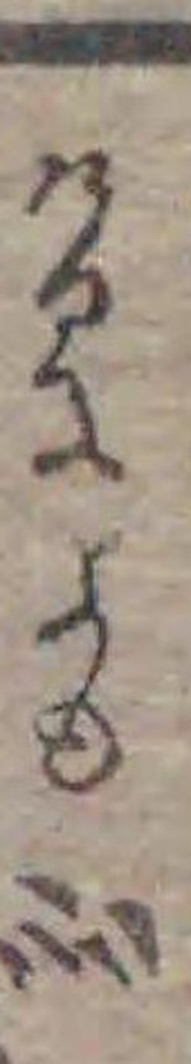けるによも
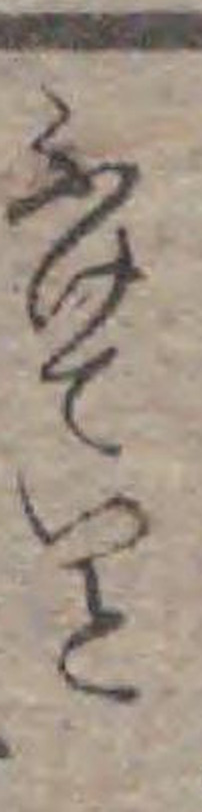ふけていと
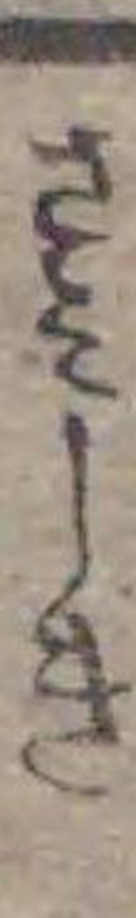さみしき
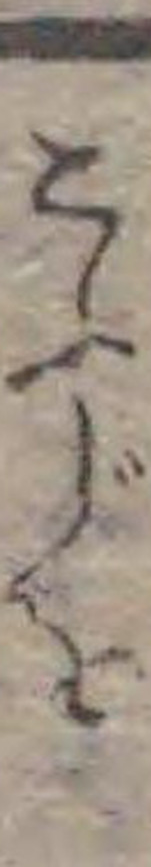こふじを
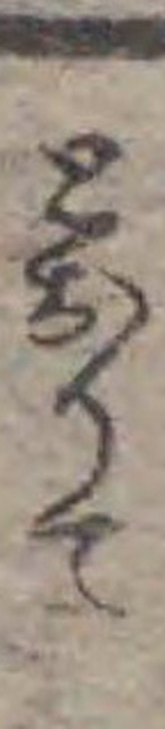とおりて
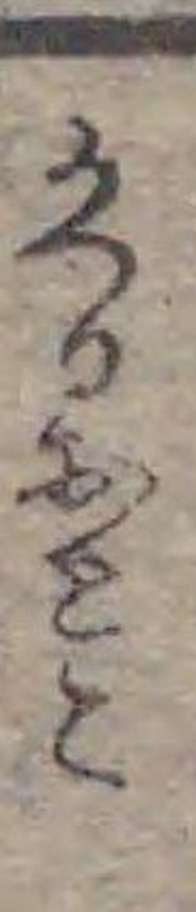かへるおとこ
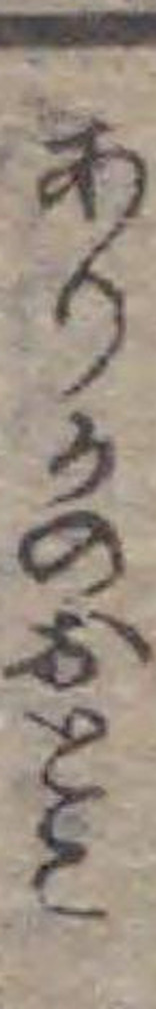ありかのおとこ
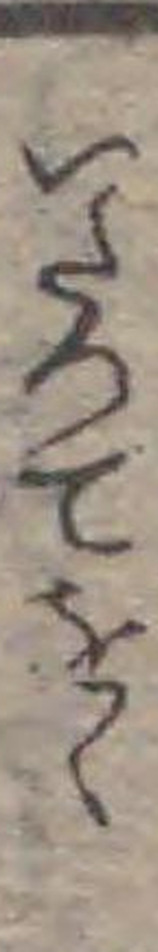いたつてをく
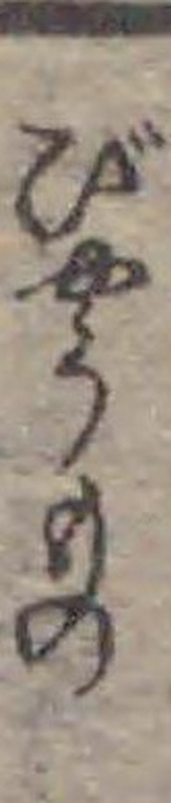びやうもの
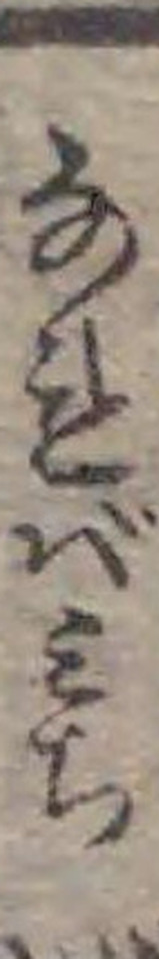なればみち
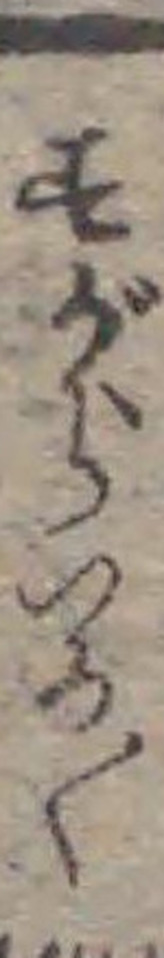すがらいろ〳〵
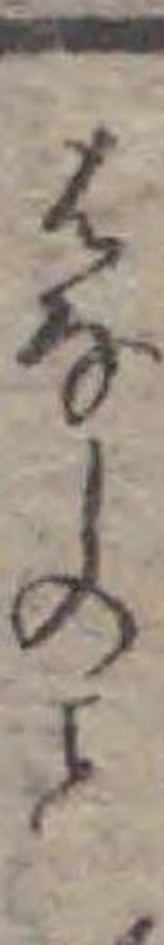はなしのこと
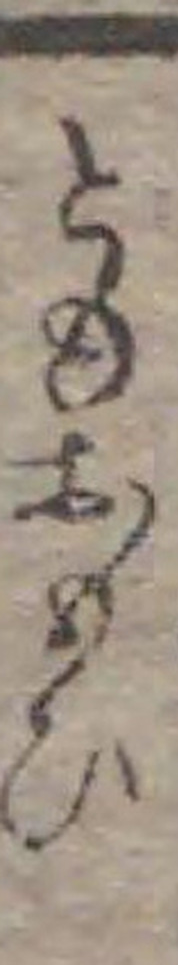ともおもひ
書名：変化物春遊 : 2巻
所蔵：国立国会図書館 National Diet Library, JAPAN
